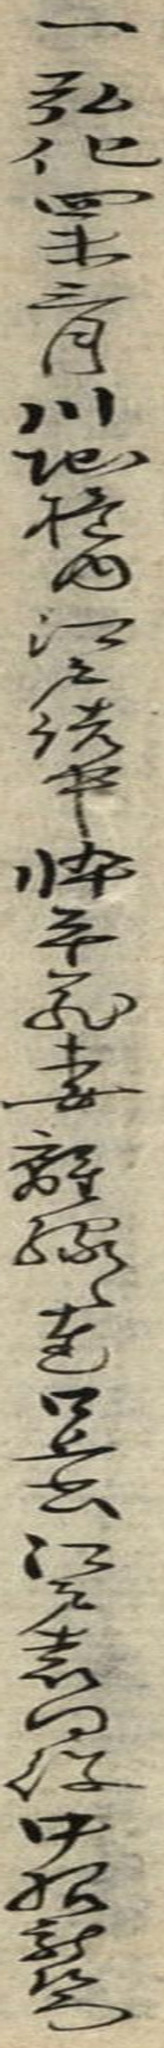一弘化四未三月川地権内江戸詰中悴平蔵妻離縁候達口上書江戸表同役中根新左衛門
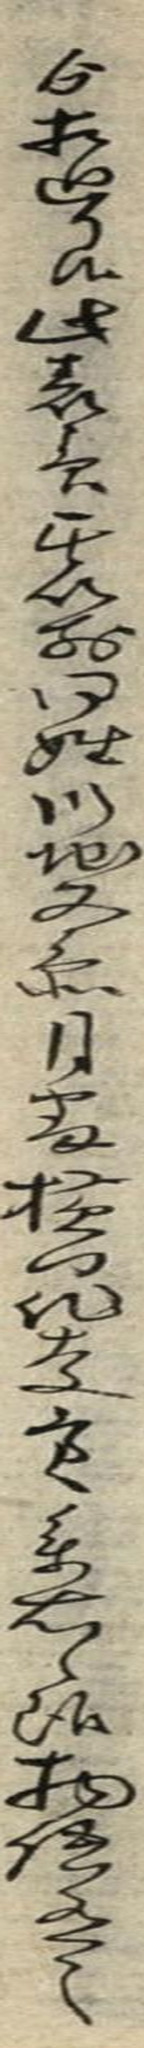ゟ相廻り候此表ニ而ハ其以前同姓川地又兵衛月番横田作大夫方へ参右之趣物語有之
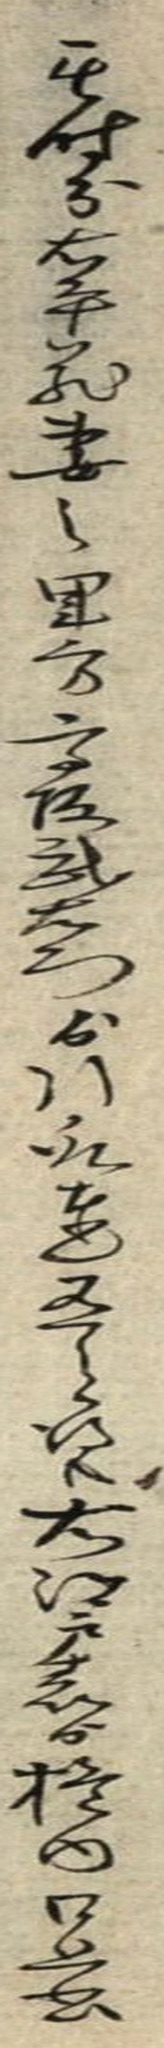其時分右平蔵妻之里方高坂武右衛門ゟ引取達有之候得共右江戸表ゟ権内口上書
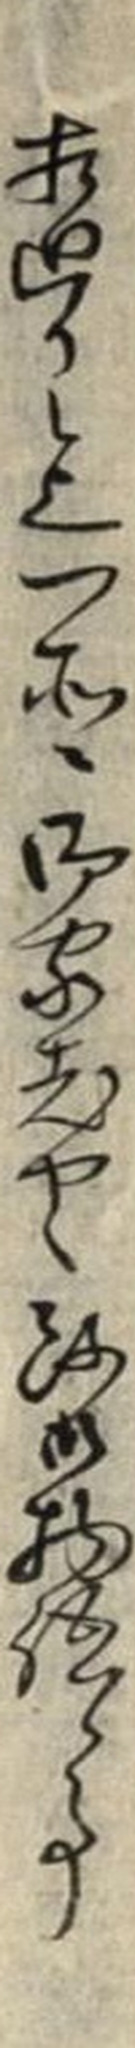相廻り候上一所ニ御家老中へ致御物語候事
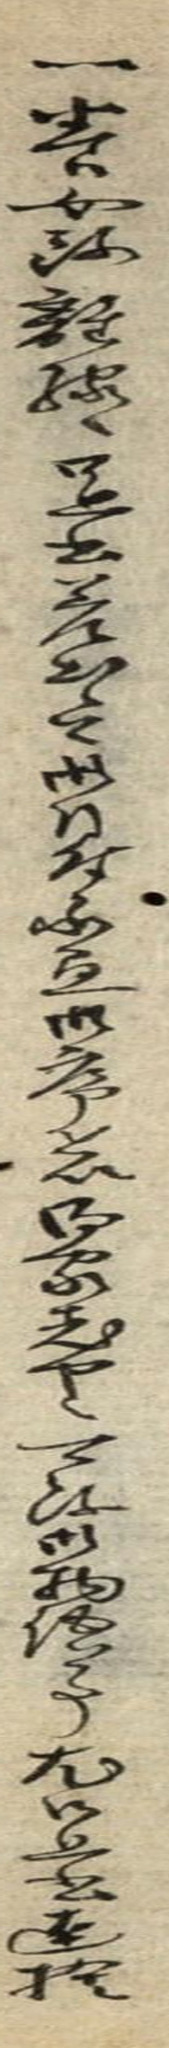一養女致離縁候口上書差出候ハヽ御目付承置御序を以御家老中へ可致御物語事尤口上書達捨
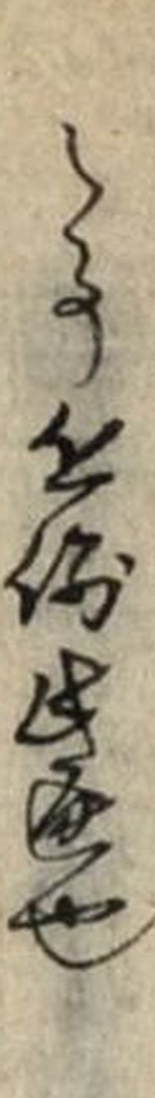候事近例此通也
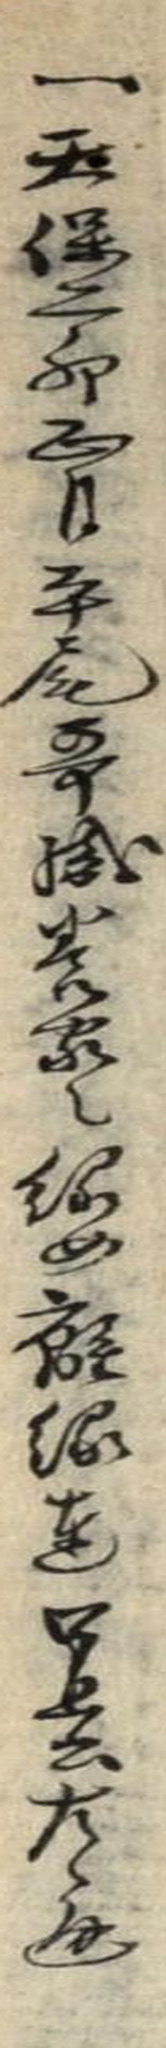一天保二卯正月平尾哥織養家之縁女離縁達口上書左之通

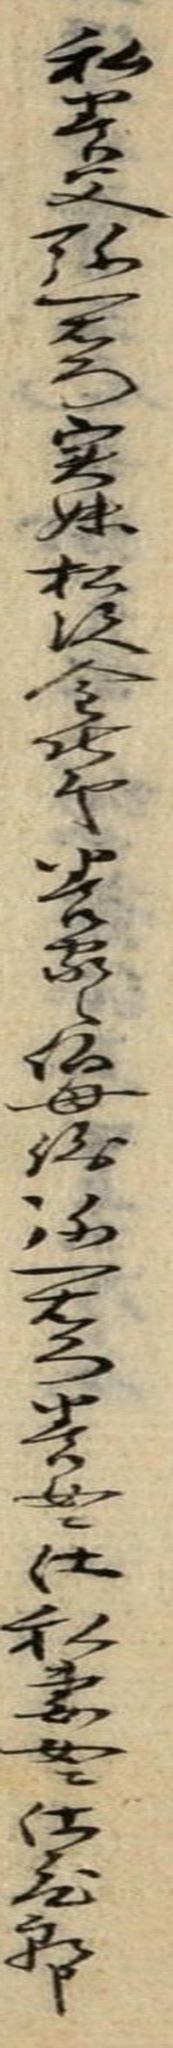私養父弥一右衛門実妹松沢金次郎養家之伯母側弥一右衛門養女ニ仕私妻女ニ仕度願申
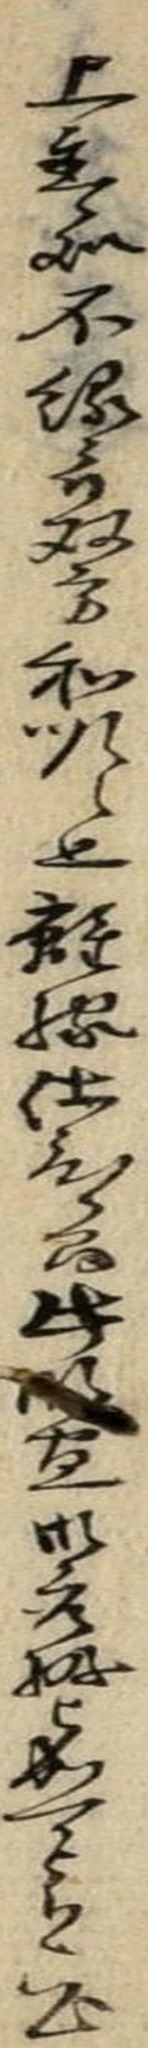上置候処不縁ニ付双方和順之上離縁仕度候間此段宜御取扱被成可被下候以上
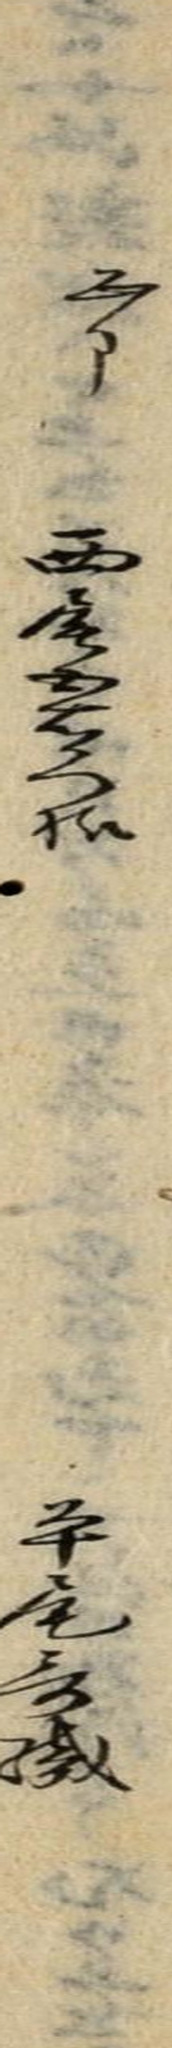正月西尾五右衛門様平尾哥織
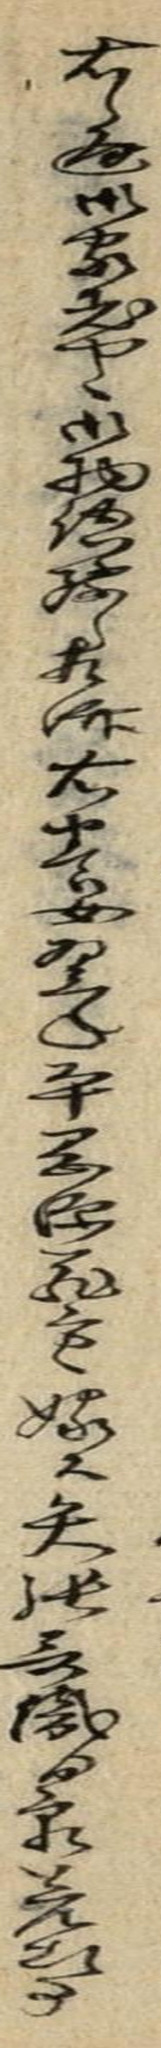右之通御家老中へ御物語致し相済右養女翌年平岡源蔵方へスす矢張哥織ゟ願差出候事
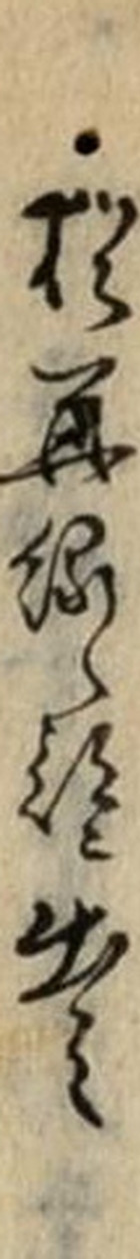猶再縁之部ニ出之
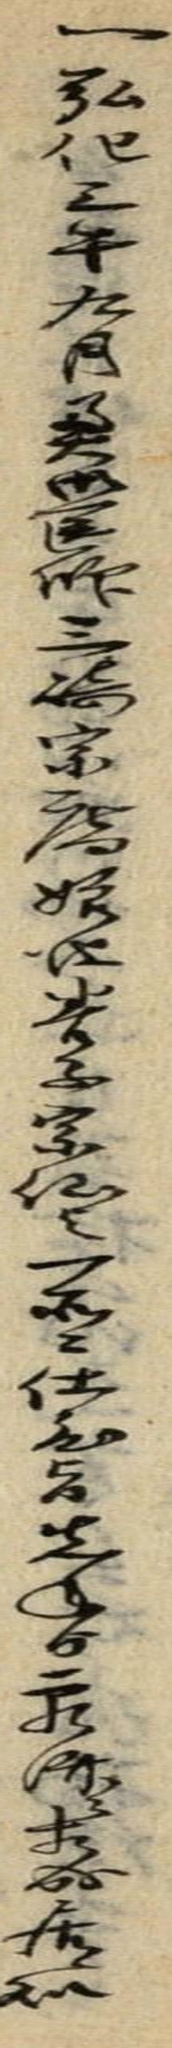一弘化三午九月奥御医師三崎宗庵娘儀養子宗仙与一所ニ仕度旨先年ゟ願済にニ相成居候処
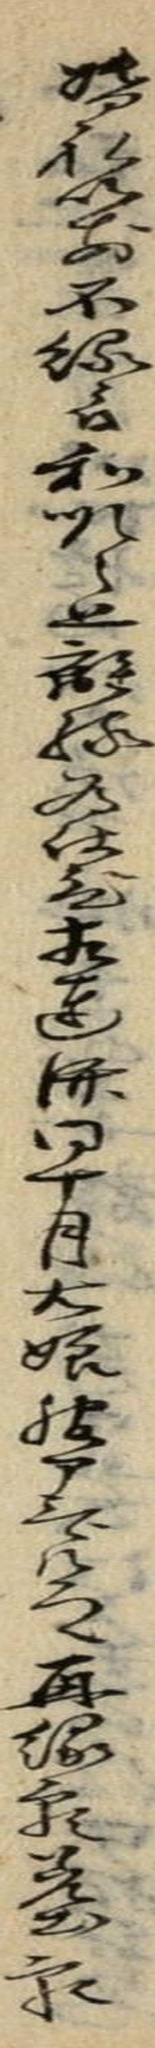婚礼以前不縁ニ付和順之上離縁為仕度相達済同十月右娘服部三郎左衛門へ再縁願差出願
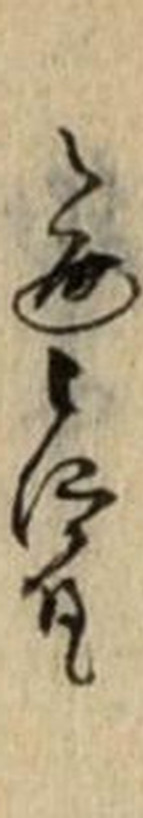之通被仰付候
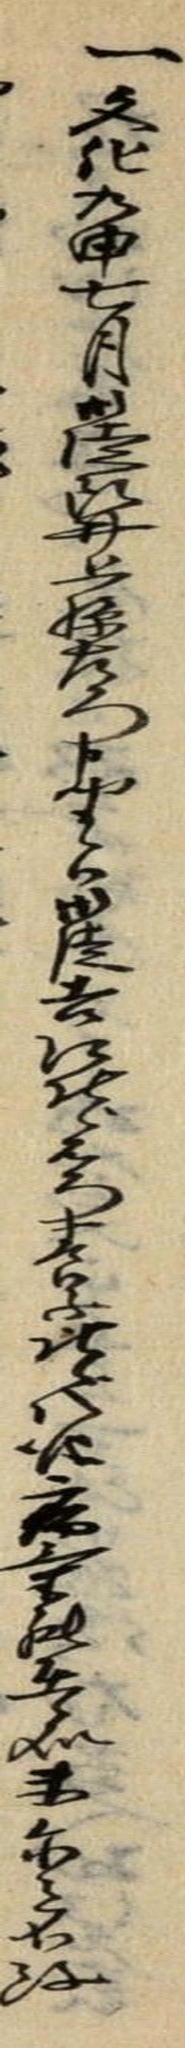一文化九申七月御徒頭井上孫左衛門申聞候ハ御徒吉江次郎右衛門養子次郎八儀病気罷在候処未爾と不致
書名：養子縁組之部
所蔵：福井県文書館 Fukui Prefectural Archives
